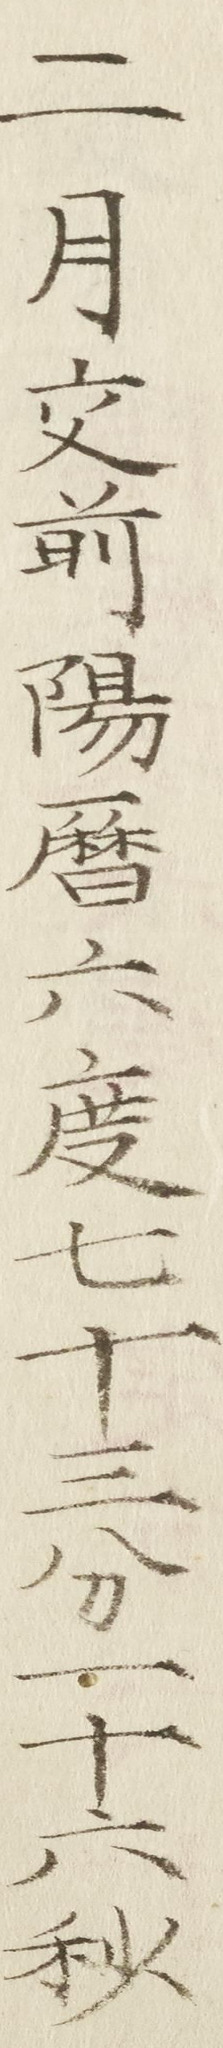二月交前陽暦六度七十三分一十六秒
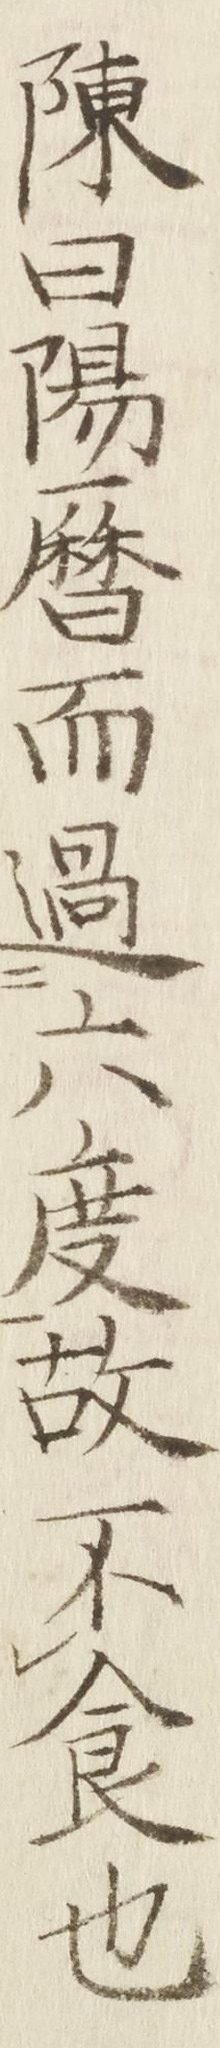陳曰陽暦而過六度故不食也
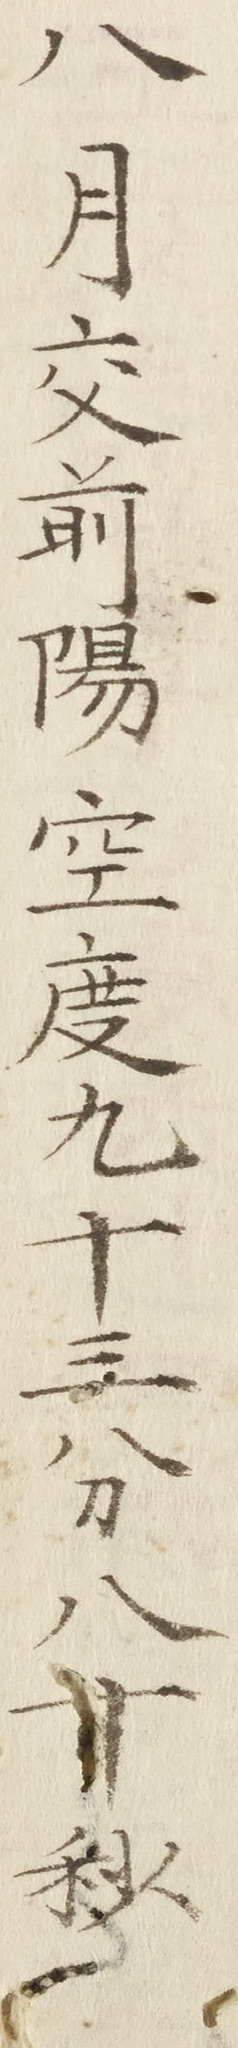八月交前陽空度九十三分八十秒

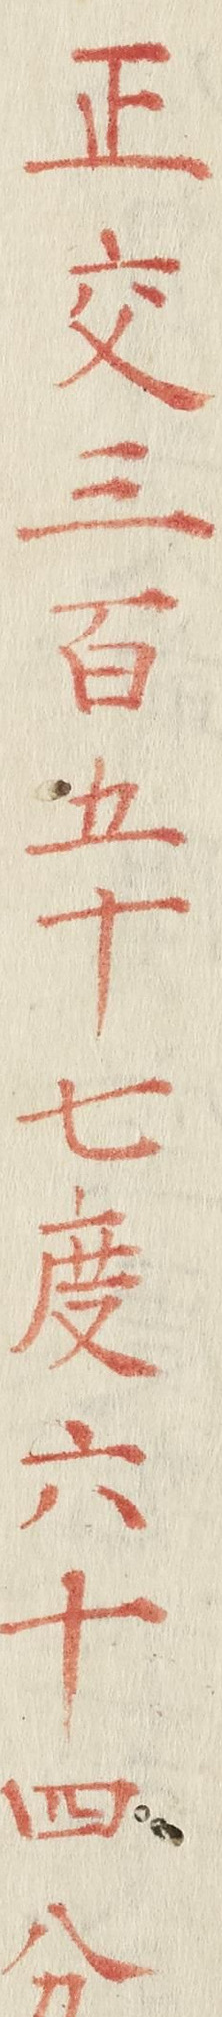正交三百五十七度六十四分
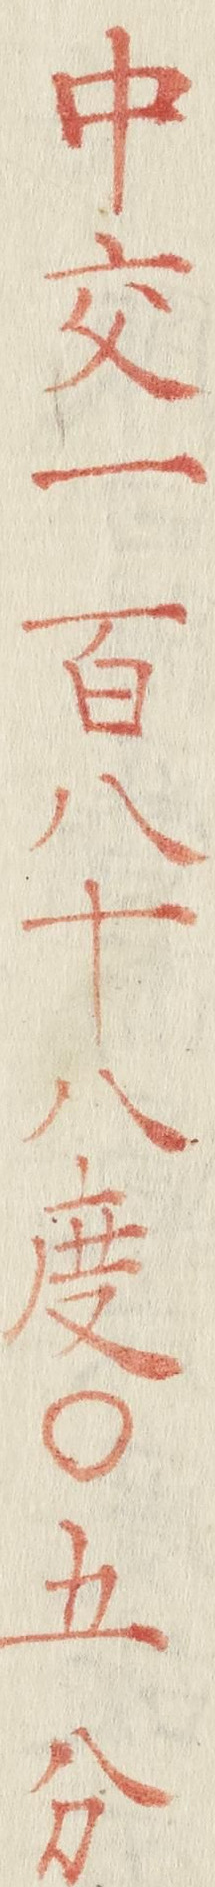中交一百八十八度〇五分
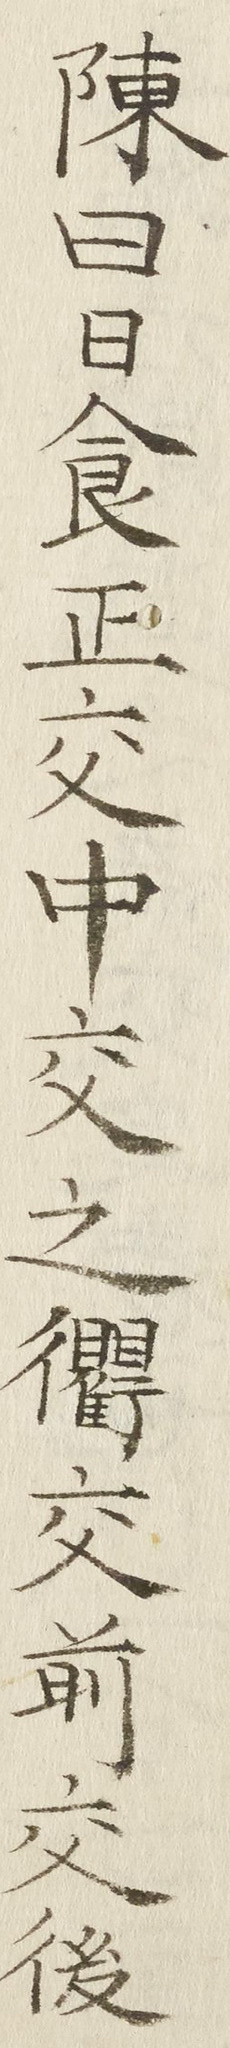陳曰日食正交中交之衢交前交後
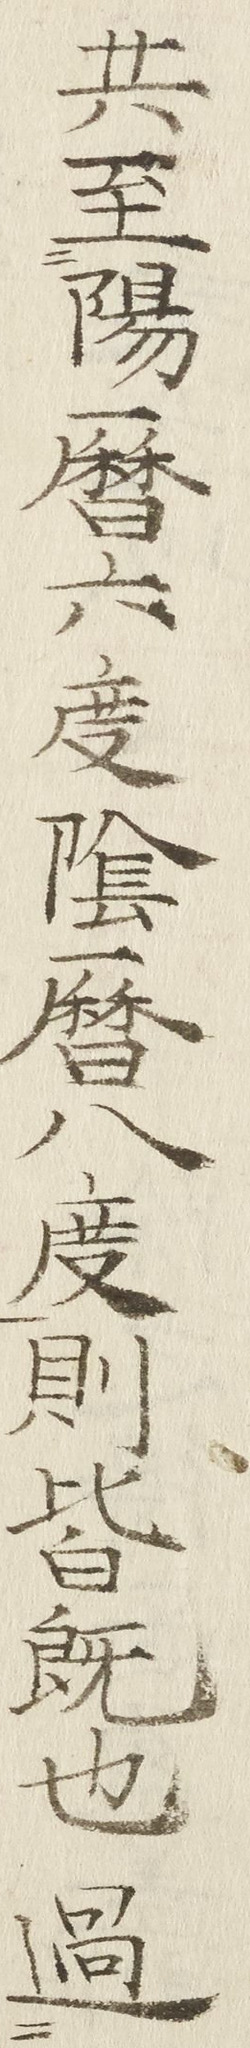共至陽暦六度陰暦八度則皆既也過
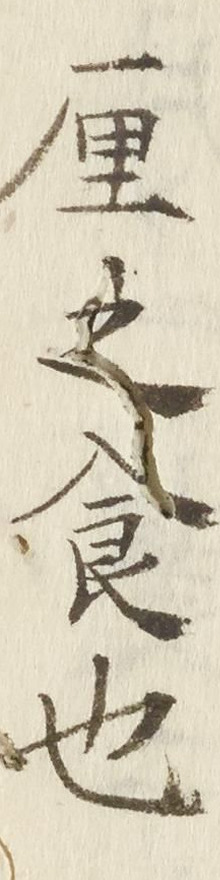厘之食也
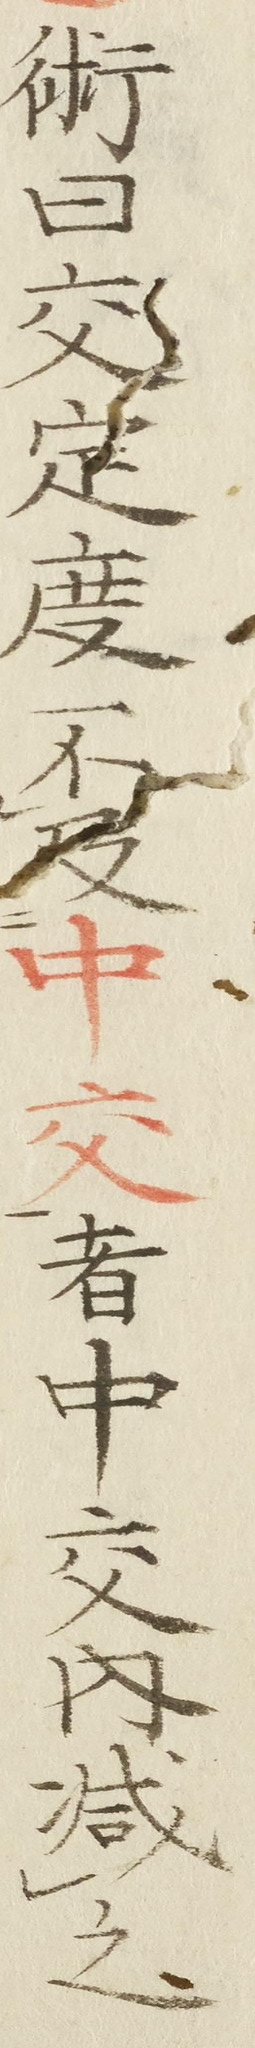○術曰交定度不及中交者中交内減之
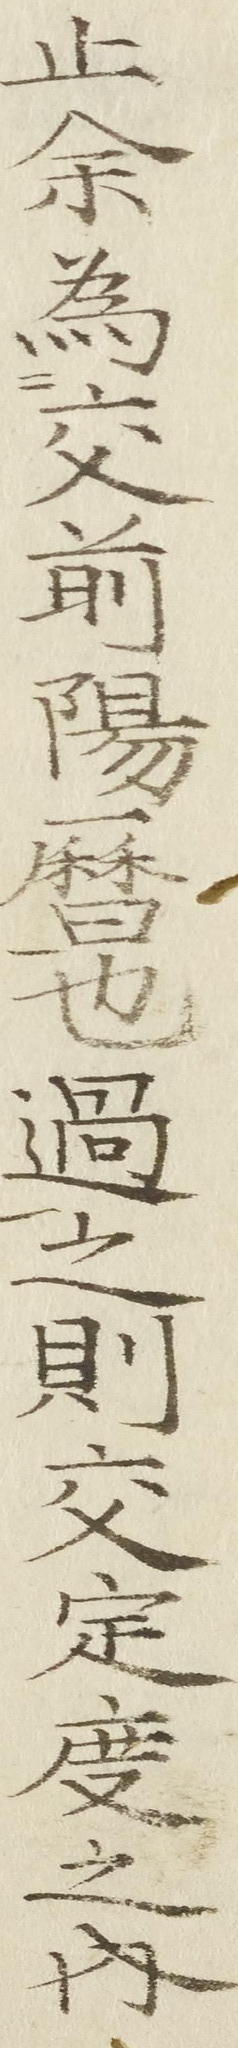止余為交前陽暦也過之則交定度之内
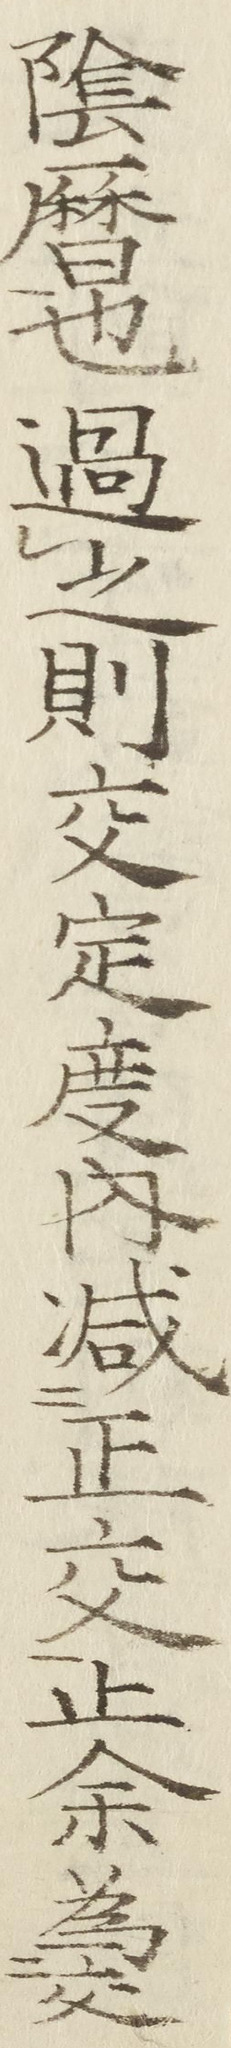陰暦也過之則交定度内減正交止余為交
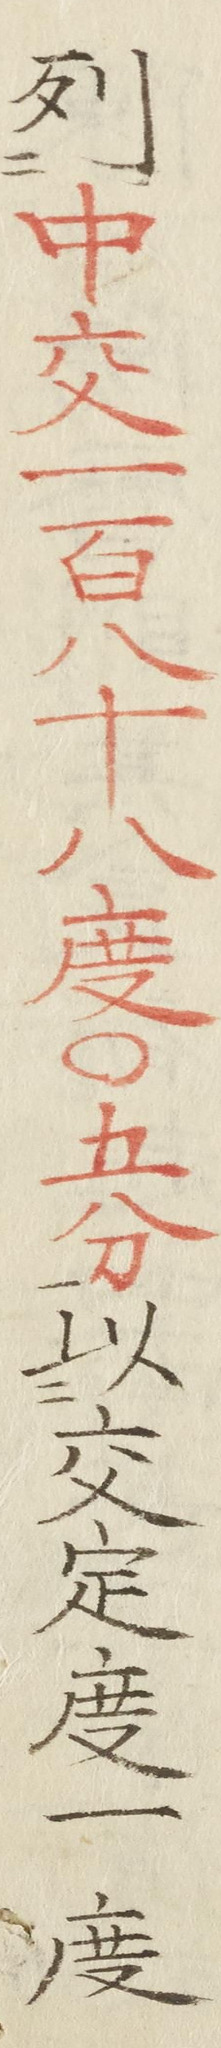列中交一百八十八度〇五分以交定度一度
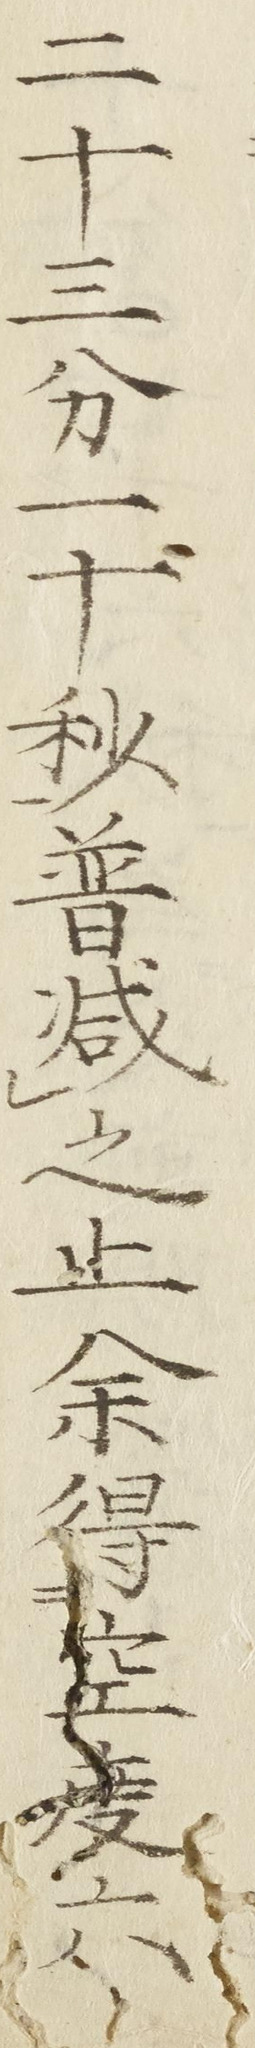二十三分一十秒普減之止余得空度六

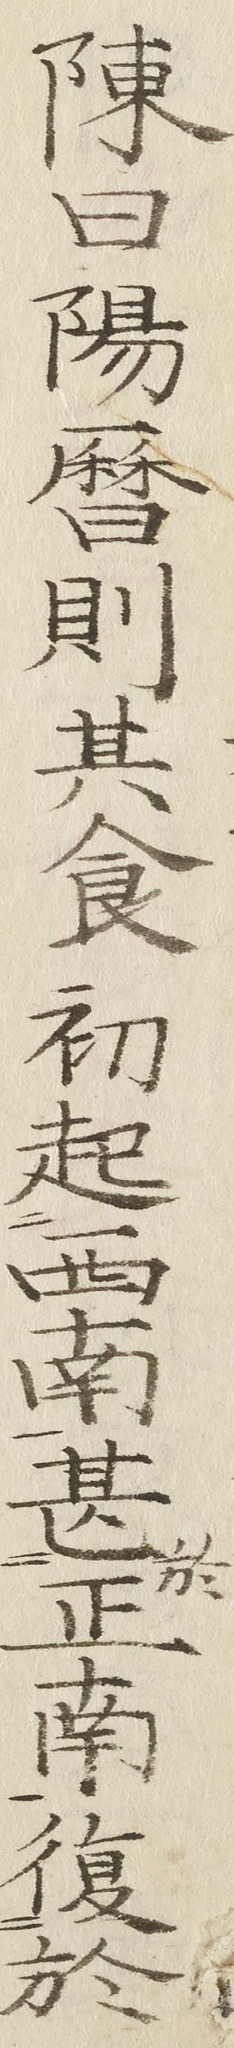陳曰陽暦則其食初起西南甚於正南復於
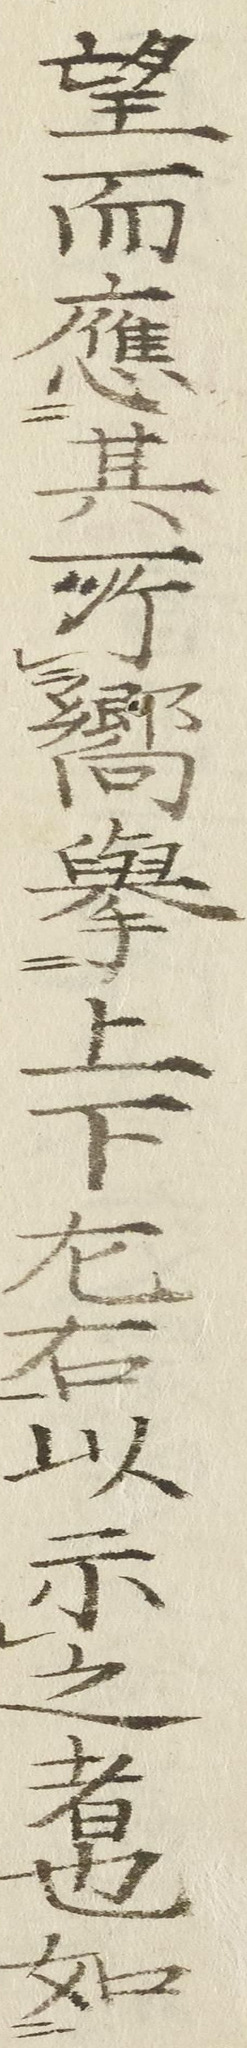望而応其所二嚮挙上下左右以示之者也如
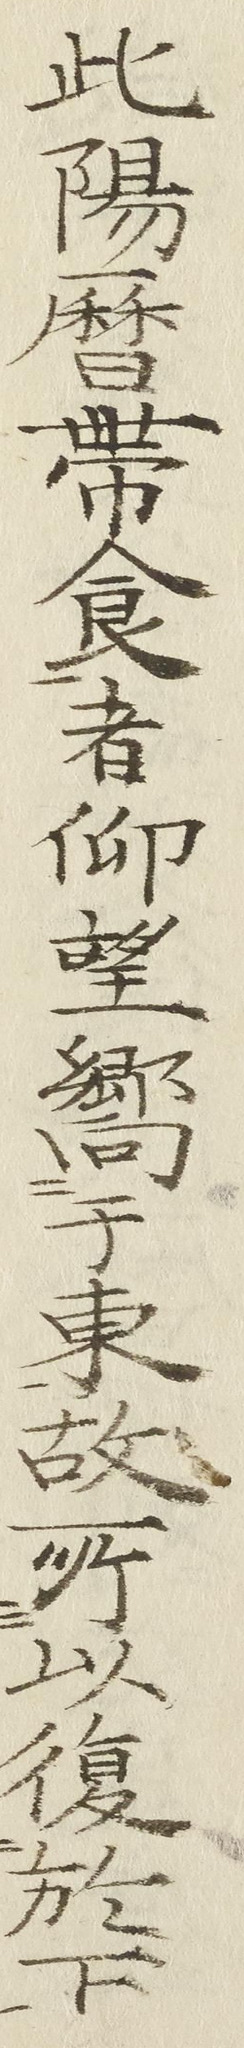此陽暦帯食者仰望嚮于東故所以復於下
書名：日食度
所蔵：東京大学地震研究所図書室 Earthquake Research Institute Library, The University of Tokyo, JAPAN
